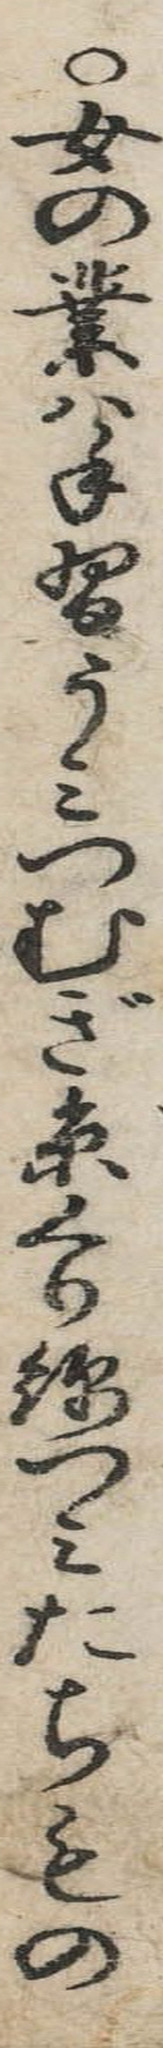〇女の業は手習うみつむぎ糸くり綿つみたちもの

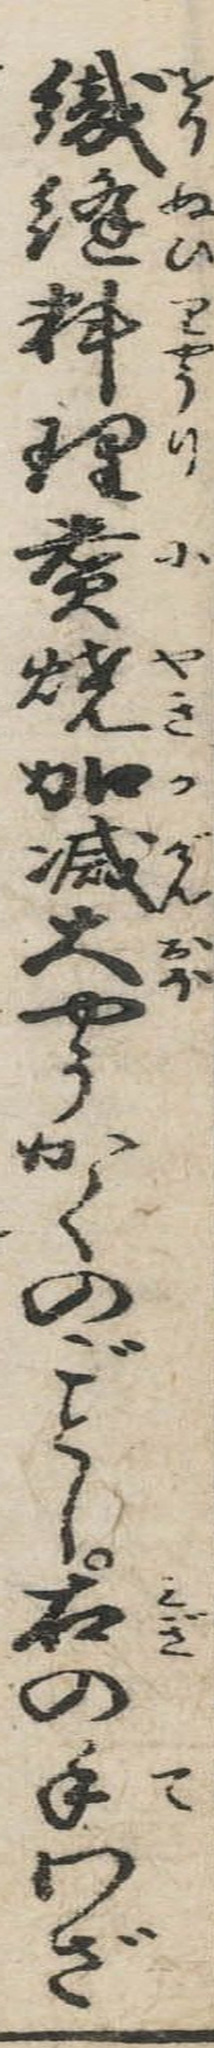織縫料理煮焼加減大やうかくのごとし。右の手わざ
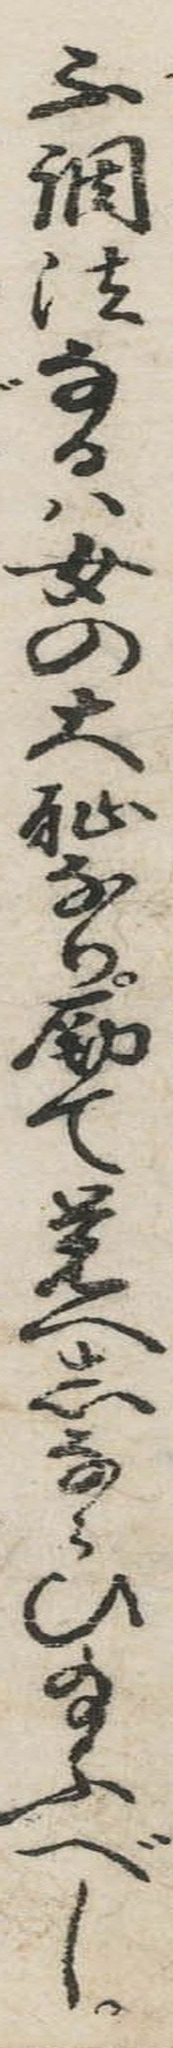不調法なるは女の大恥なり励て覚へしならひ給ふべし。
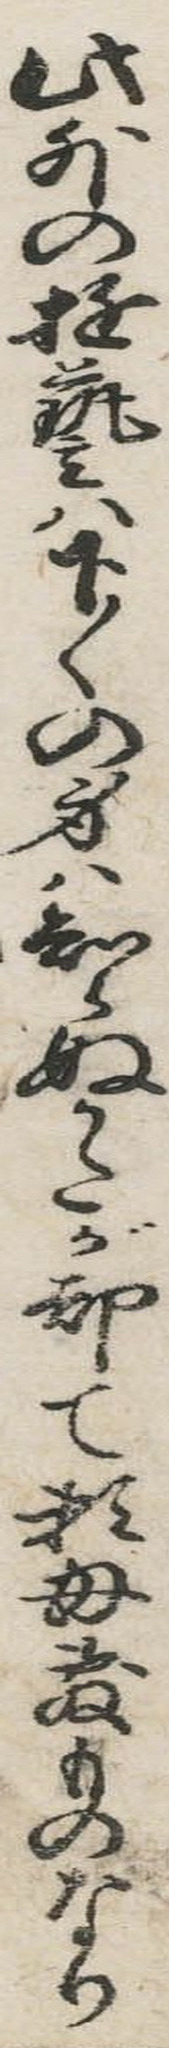此外の遊芸は下〳〵の身は知らぬかたが却て頼母敷ものなり
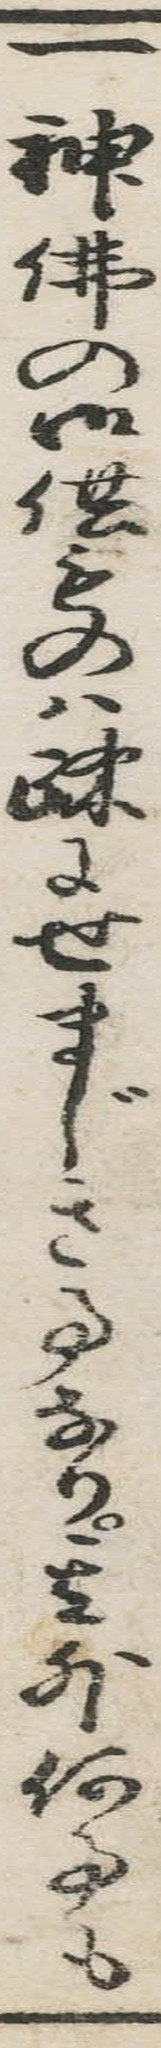一神仏の御供ものは疎にせまじき事なり。其外何事も
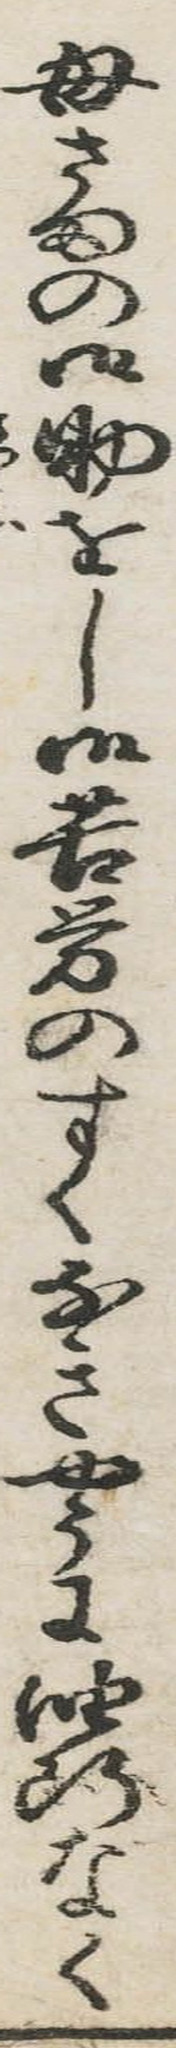母さまの御助をし御苦労のすくなきやうに油断なく
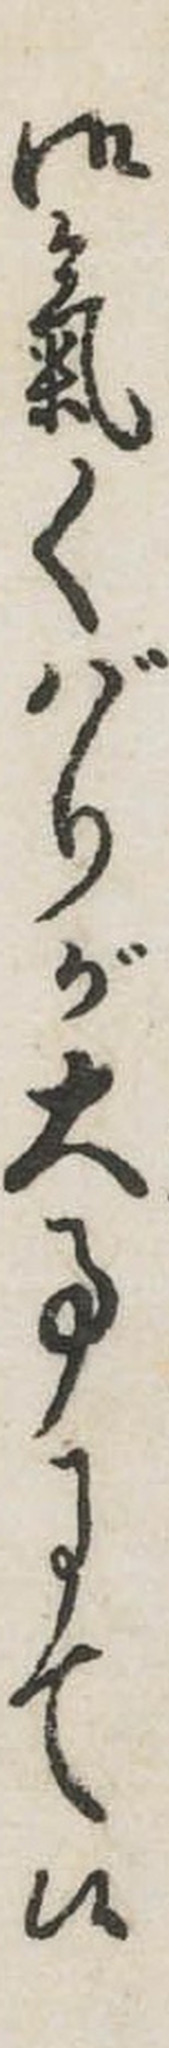御気くばりが大事にて候
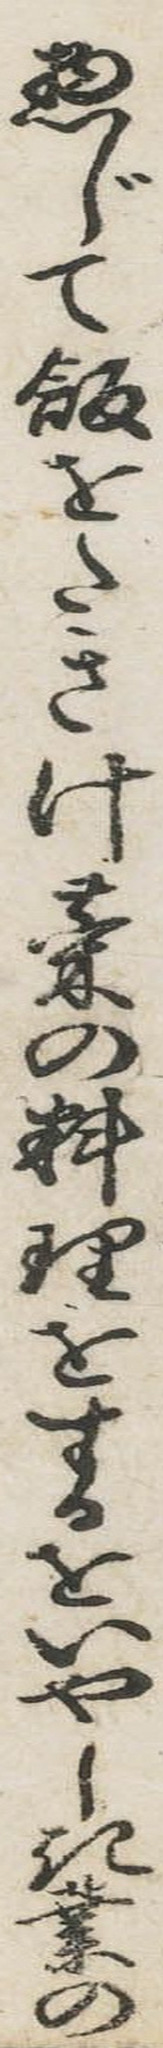惣じて飯をたき汁菜の料理をするをいやしき業の
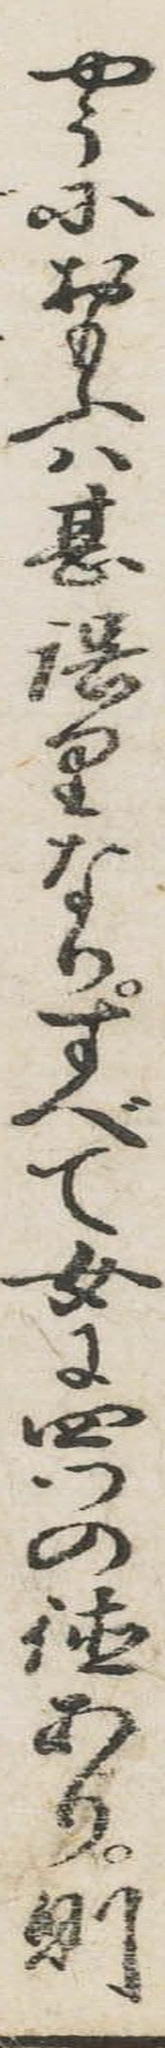やうにおもふは甚誤りなり。すべて女に四つの徳あり。則
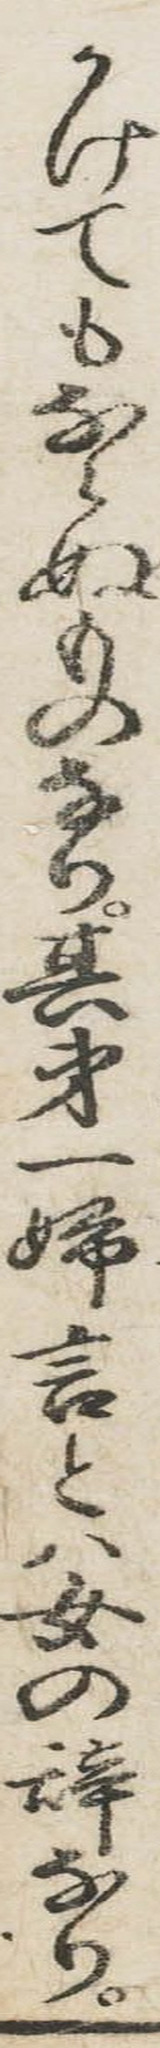かけてもならぬものなり。其第一婦言とは女の辞なり。
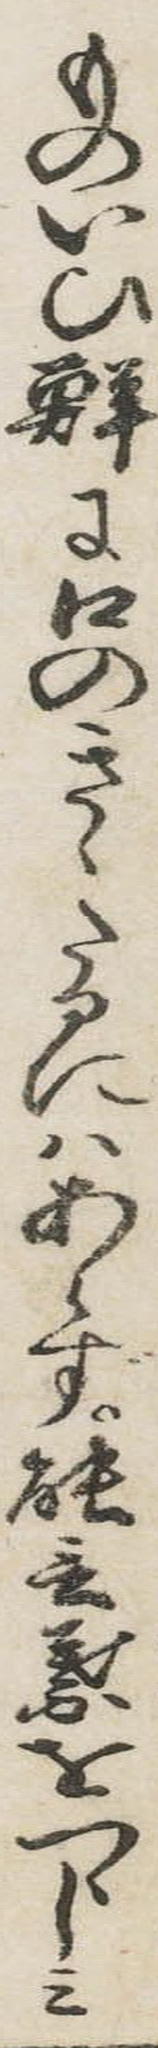ものいひ鮮に口のきゝたるにはあらす。能言葉をつゝしみ
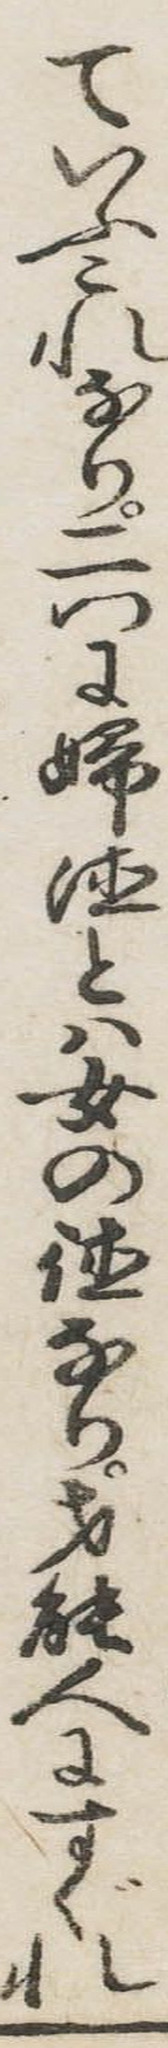ていふこれなり。二つに婦徳とは女の徳なり。才能人にすぐれ
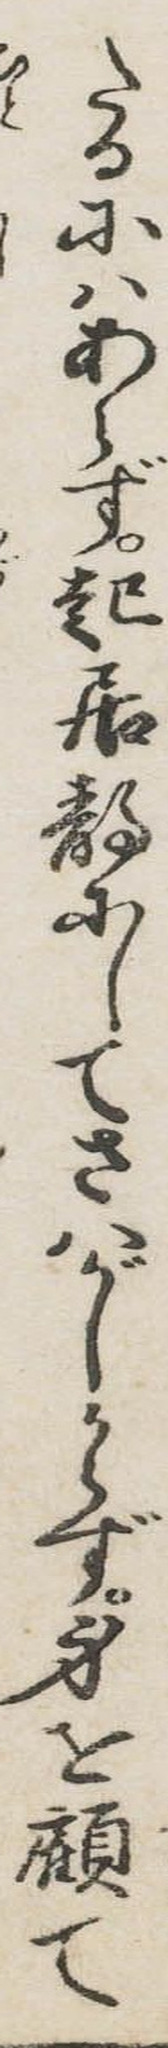たるにはあらず。起居静にしてさはがしからず。身を顧て
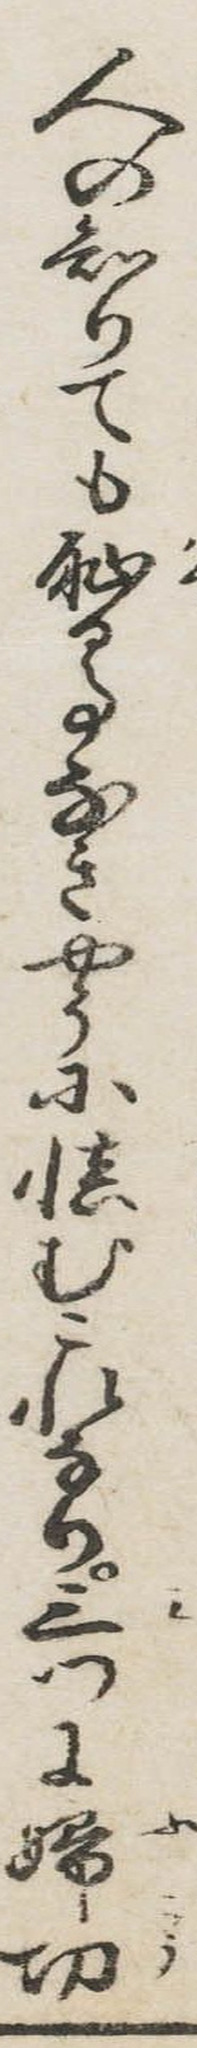人の知りても恥る事なきやうに慎むこれなり。三つに婦功
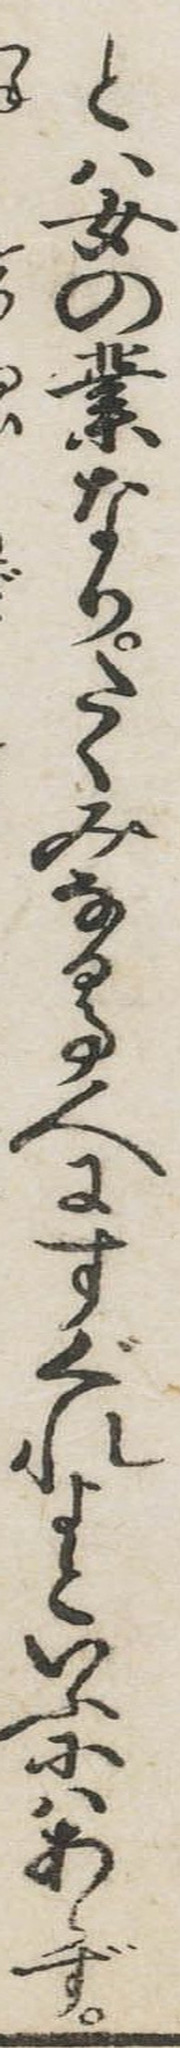とは女の業なり。たくみなる事人にすぐれよといふにはあらず。
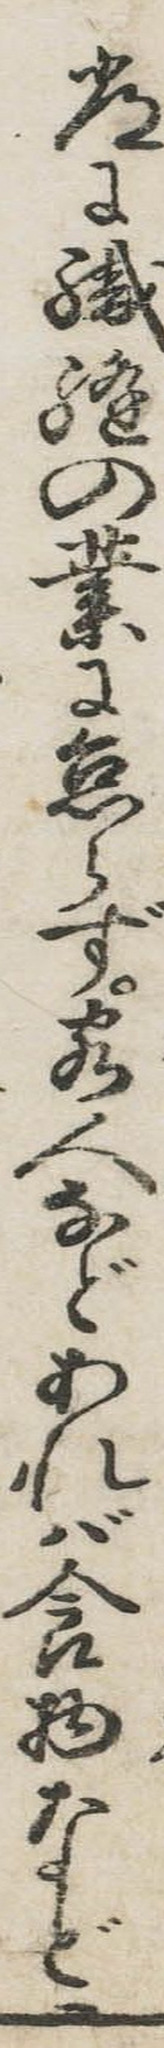常に織縫の業に怠らず。客人などあれば食物など
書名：前訓
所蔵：東京学芸大学附属図書館
